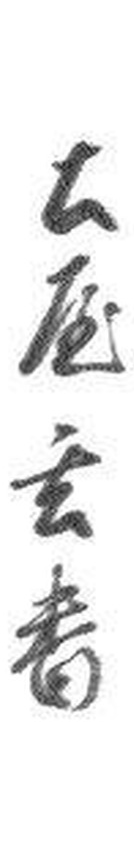土屋玄番
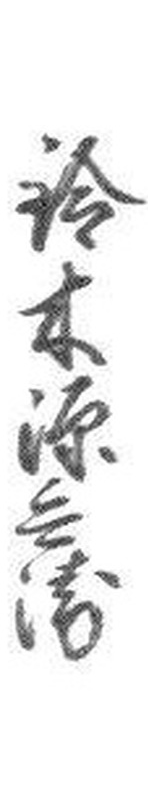鈴木源兵衛
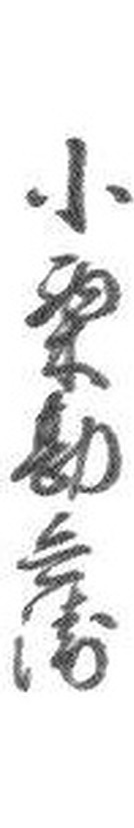小栗勘兵衛
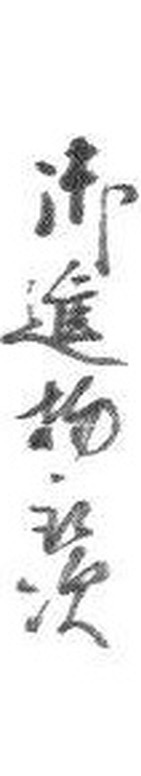御進物取次
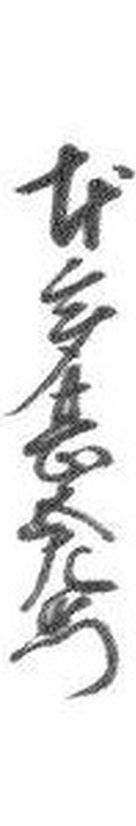本多甚五左衛門
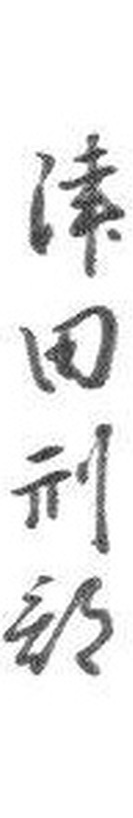津田刑部
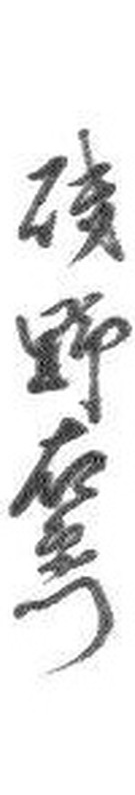磯野右衛門

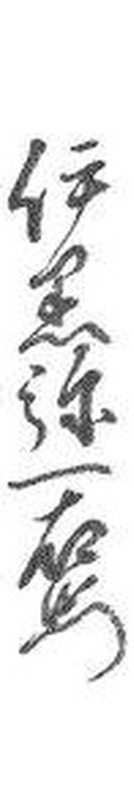伊黒弥一右衛門
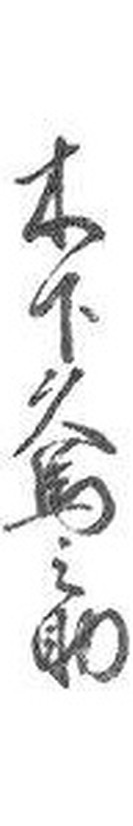木下久馬之助
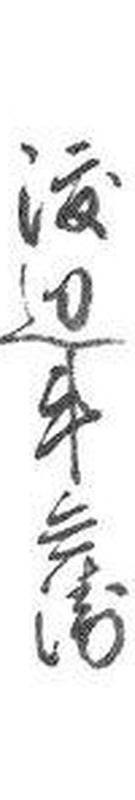渡辺牛兵衛
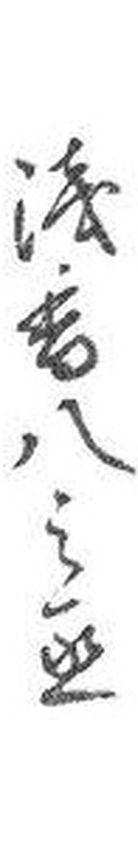浅香八之丞
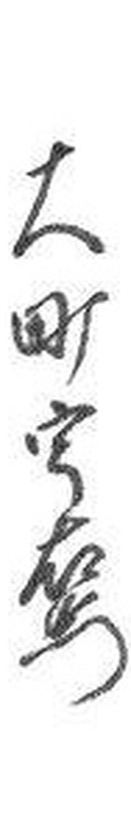大町宇右衛門
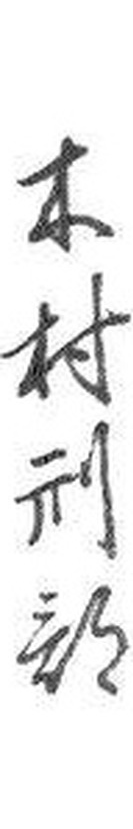木村刑部
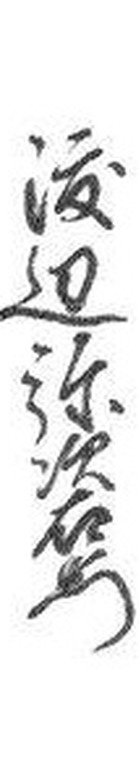渡辺弥次右衛門
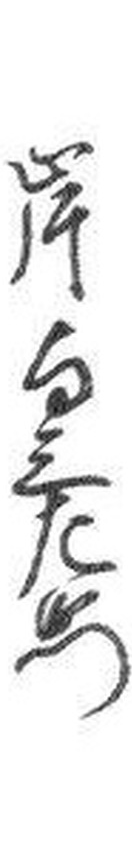岸与三左衛門
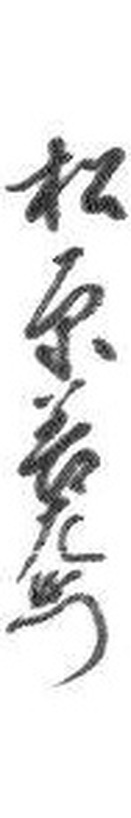松原善左衛門
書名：家譜 四 忠昌公 従寛永七年到正保四年
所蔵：福井県文書館 Fukui Prefectural Archives
